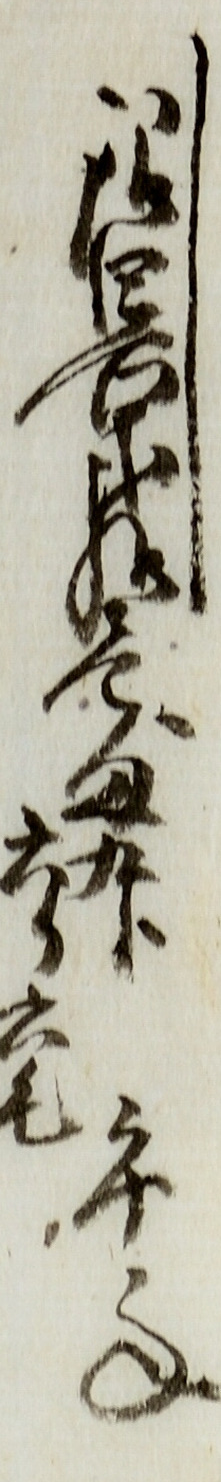銀四百弐拾壱匁九分午年
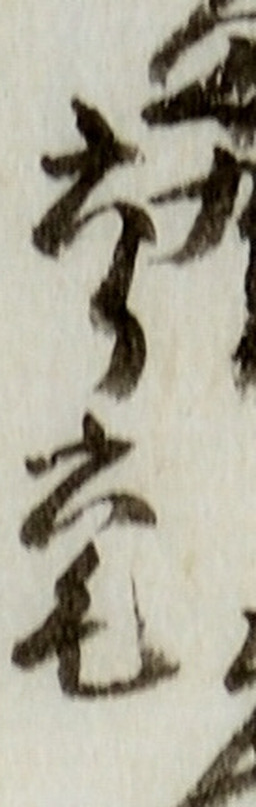六厘六毛
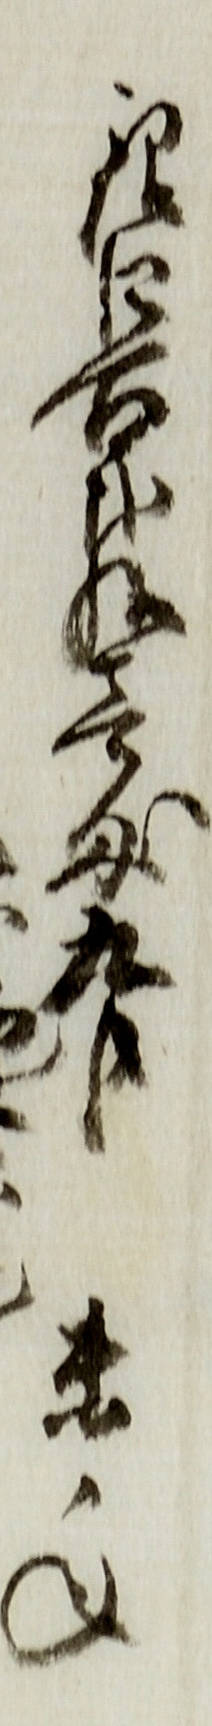銀四百弐拾壱匁九分未年
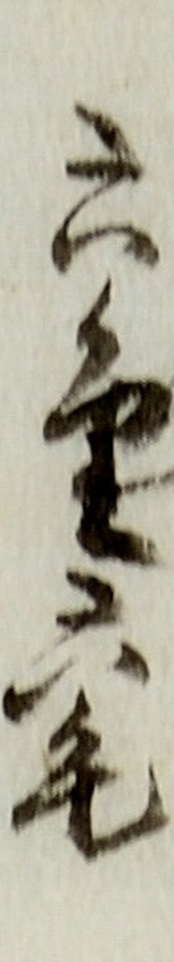六厘六毛
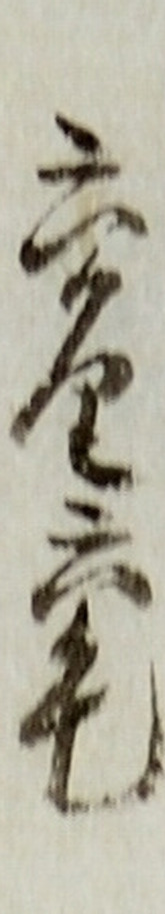六厘六毛
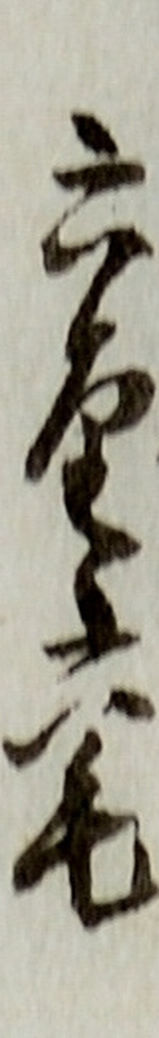六厘六毛
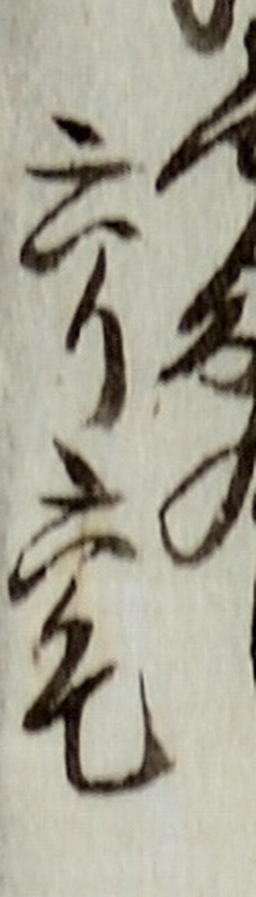六厘六毛

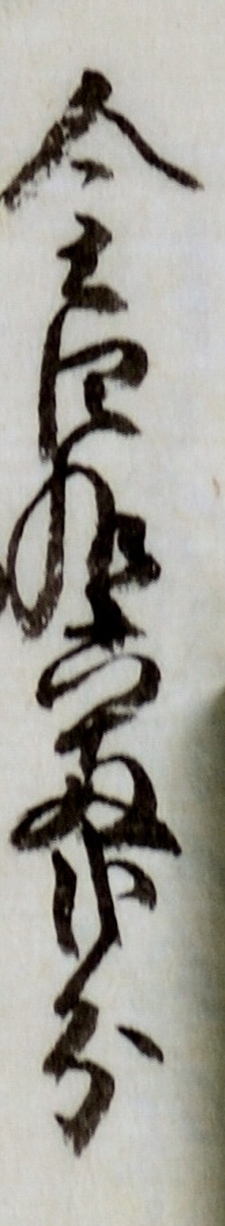金四拾六両弐分
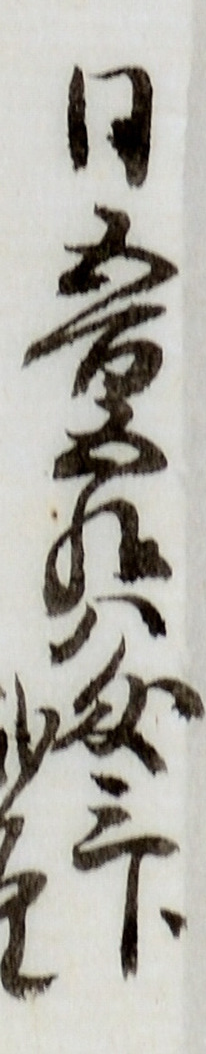同五百五拾八匁三分申年
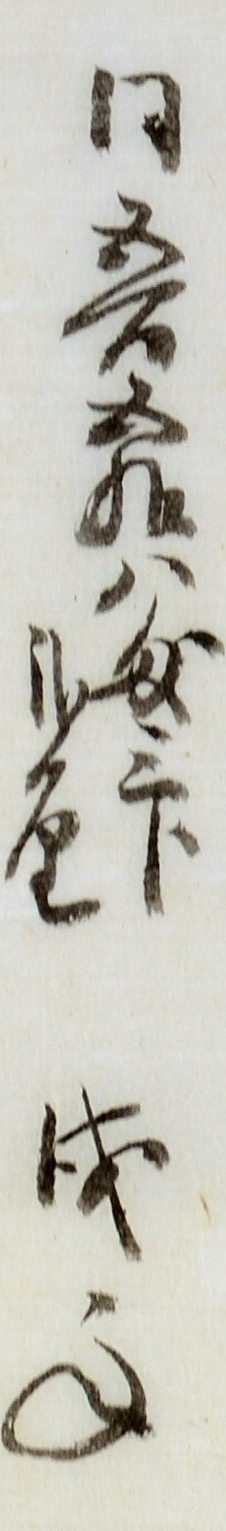同五百五拾八匁三分申年
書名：伐子年賦金上納帳
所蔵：伊那市立高遠町図書館・合同会社AMANE
